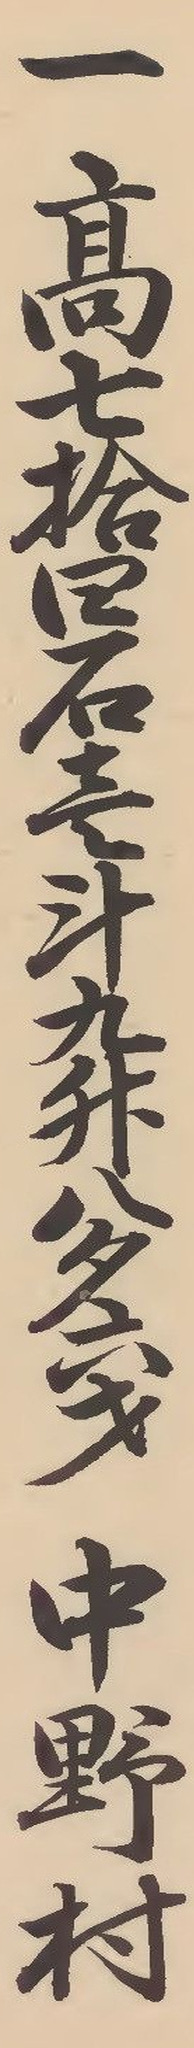一高七拾四石壱斗九升八勺六才中野村

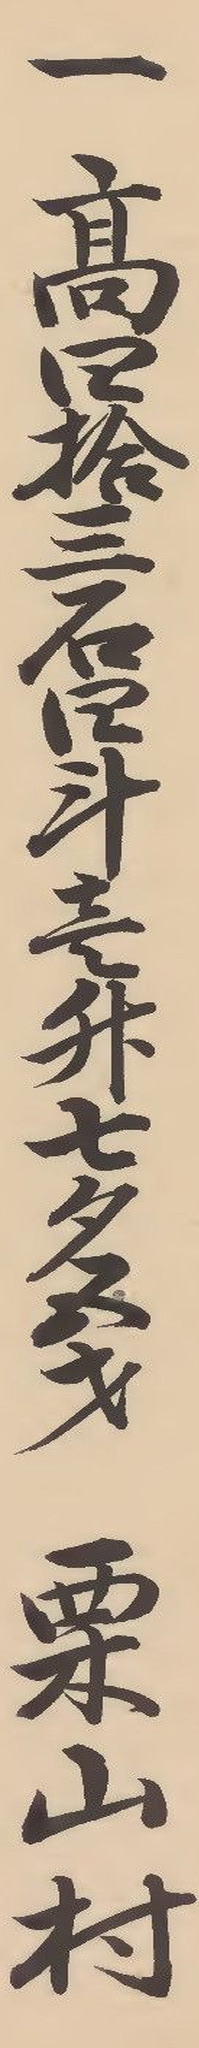一高四拾三石四斗壱升七勺五才栗山村
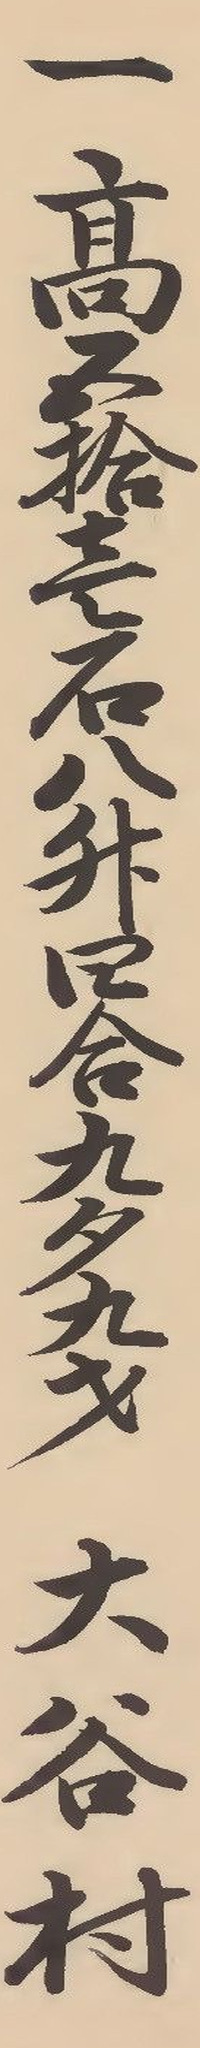一高五拾壱石八升四合九勺九才大谷村
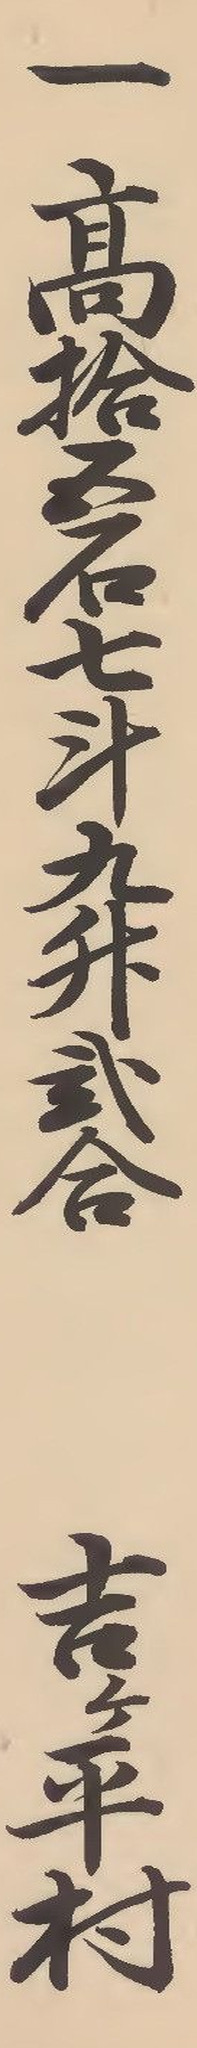一高拾五石七斗九升弐合吉ヶ平村
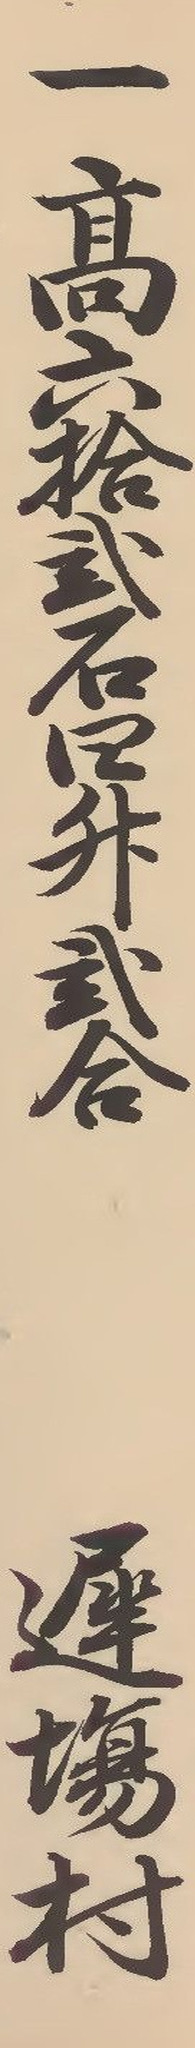一高六拾弐石四升弐合遅場村
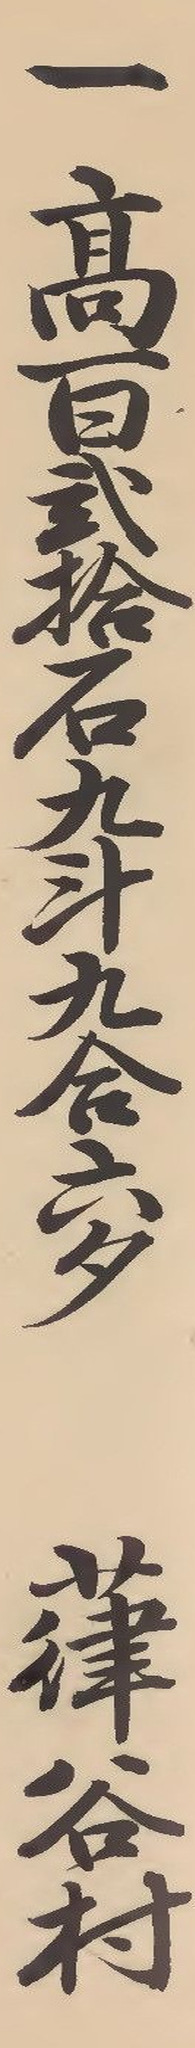一高百弐拾石九斗九合六勺葎谷村
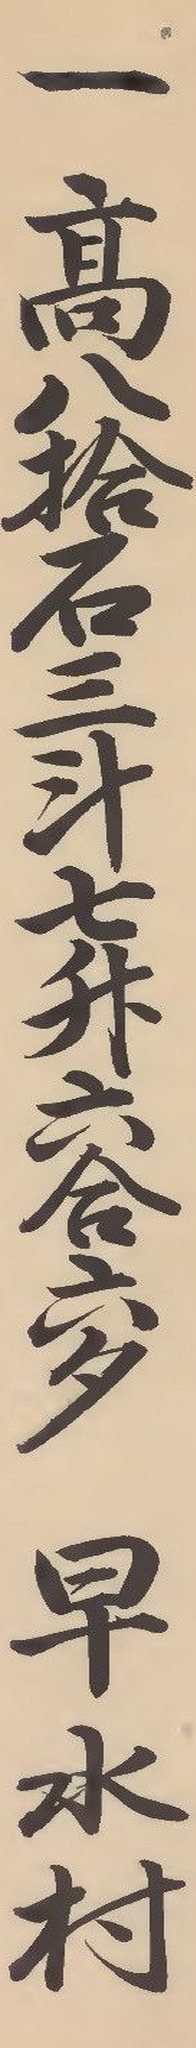一高八拾石三斗七升六合六勺早水村
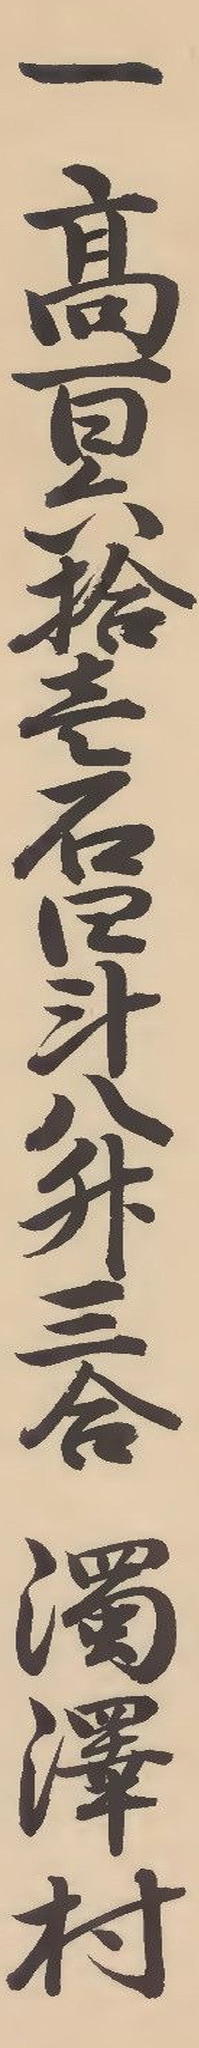一高百六拾壱石四斗八升三合濁沢村
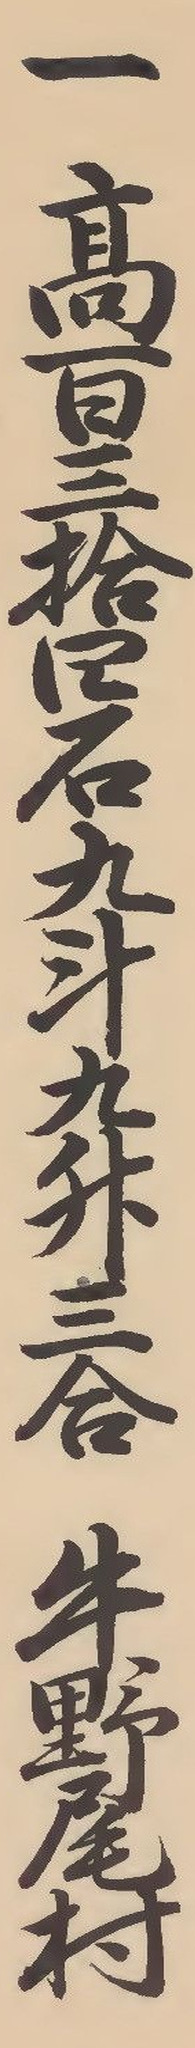一高百三拾四石九斗九升三合牛野尾村

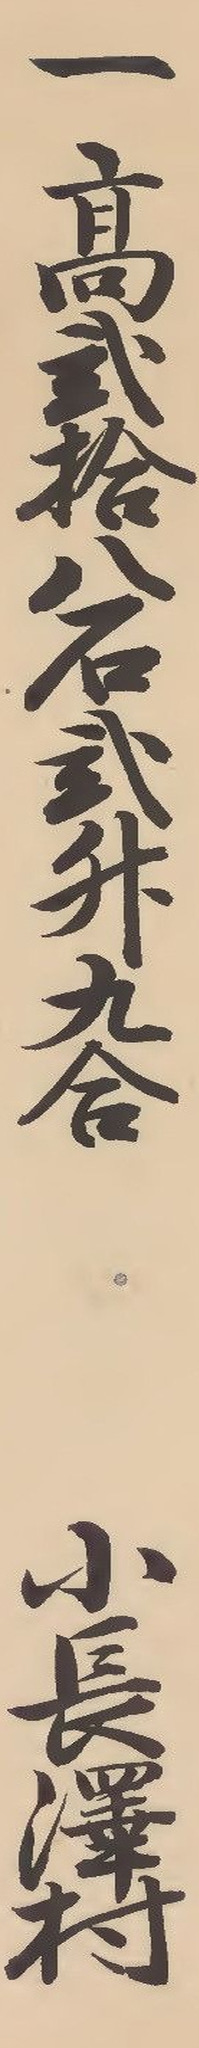一高弐拾八石弐升九合小長沢村
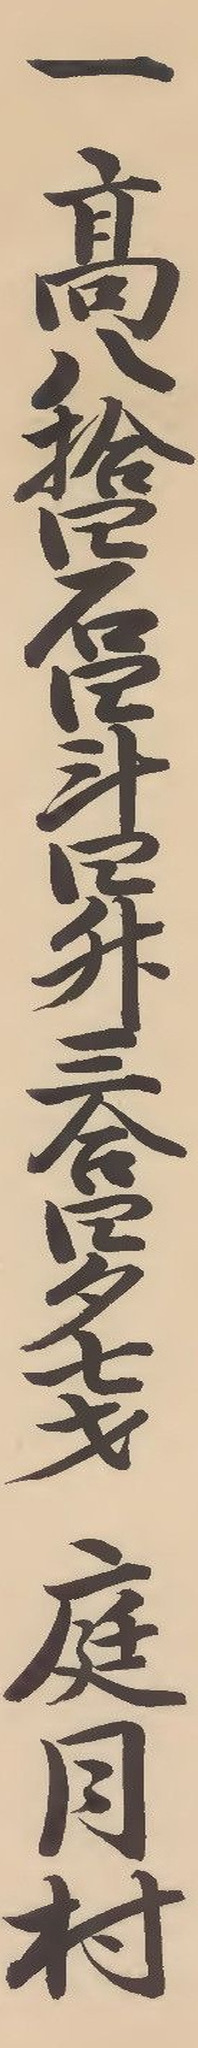一高八拾四石四斗四升三合四勺七才庭月村
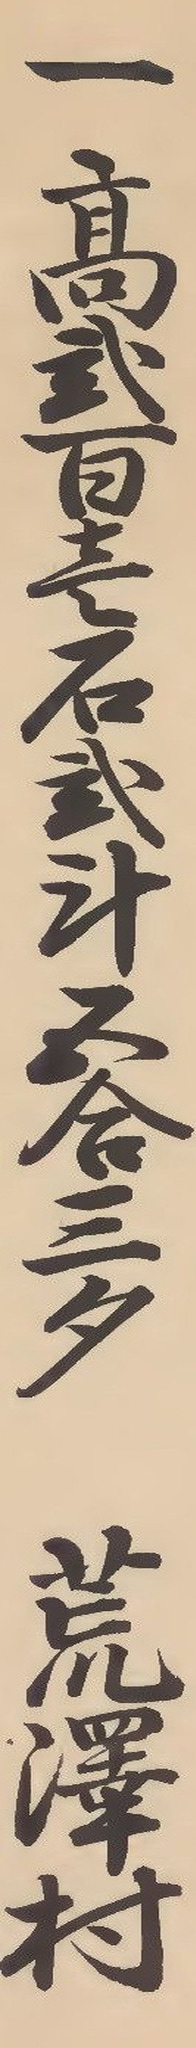一高弐百壱石弐斗五合三勺荒沢村
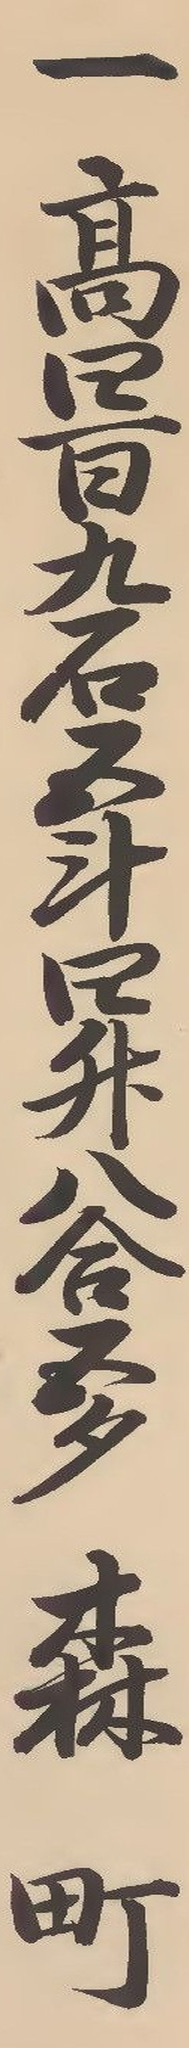一高四百九石五斗四升八合五勺森町
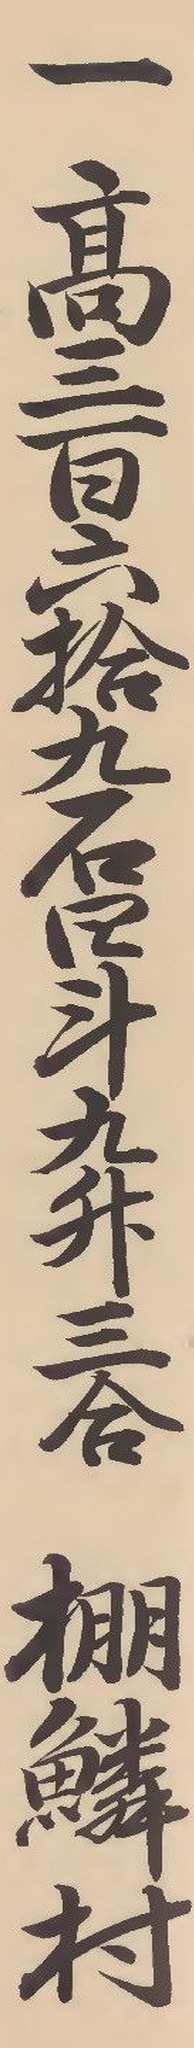一高三百六拾九石四斗九升三合棚鱗村
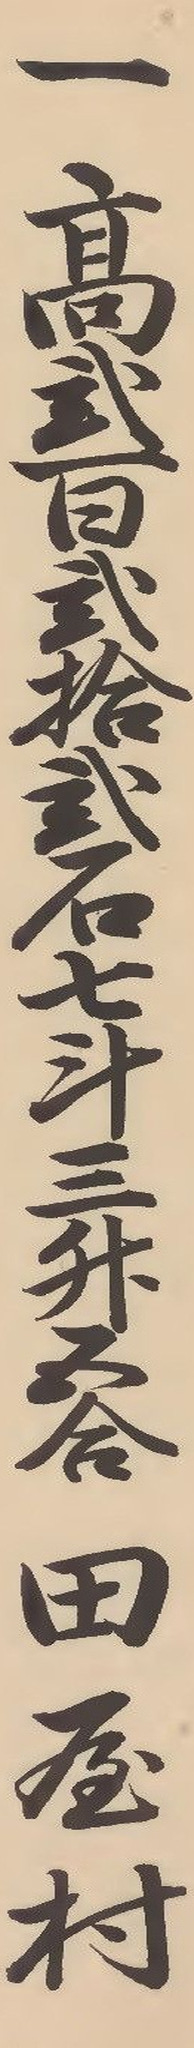一高弐百弐拾弐石七斗三升五合田屋村
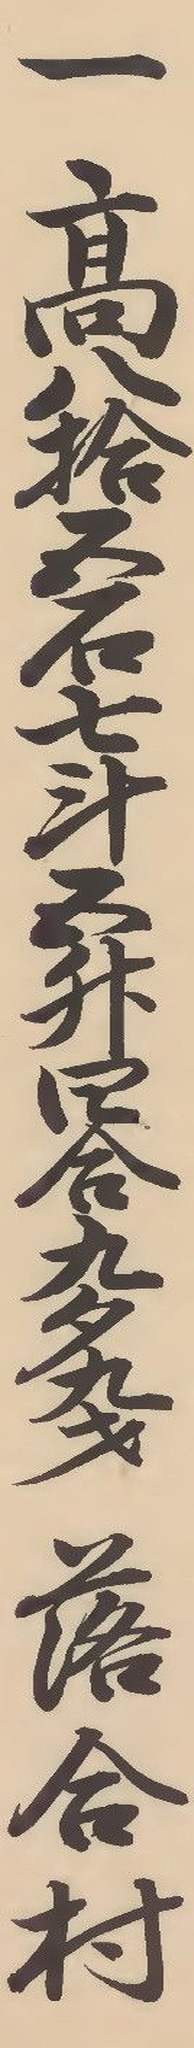一高八拾五石七斗五升四合九勺九才落合村
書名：越後国郷帳　下
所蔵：国立公文書館 National Archives of Japan
